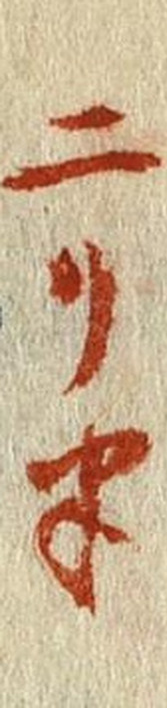二リ半
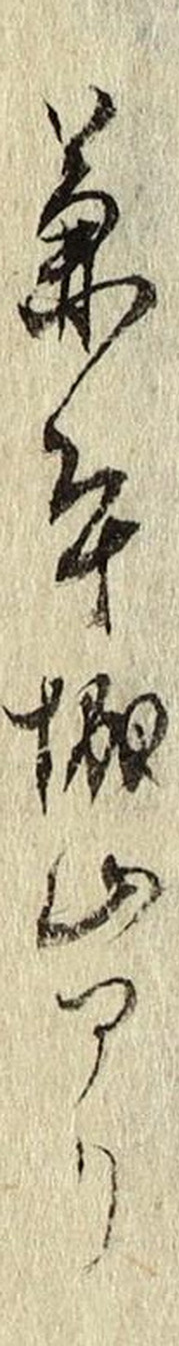兼平城山アリ
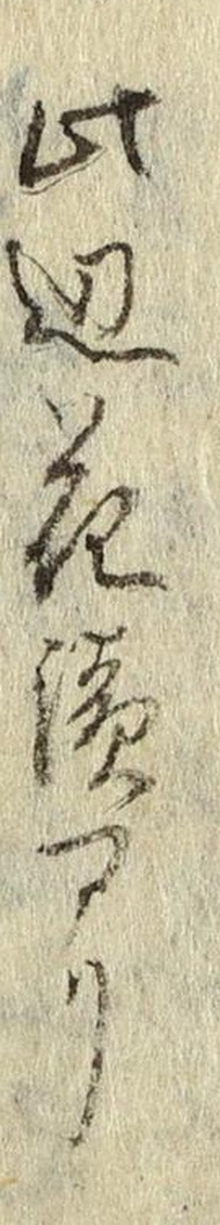此辺花漬アリ
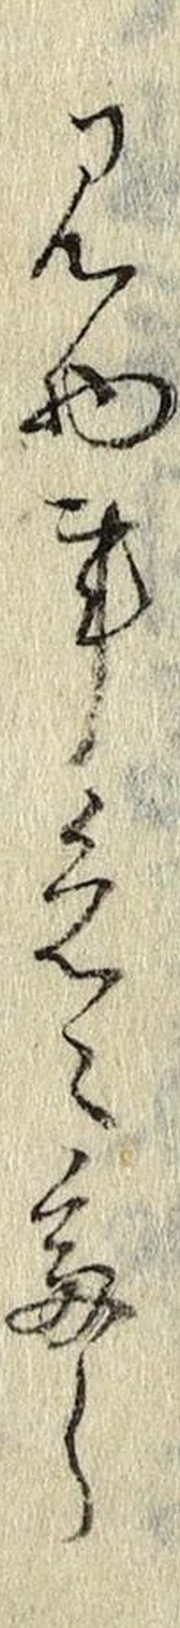見物事色々多し
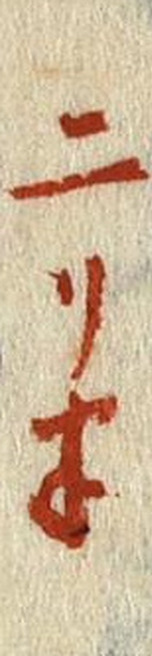二リ半
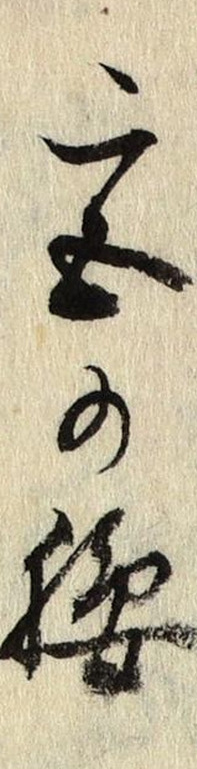宮の腰
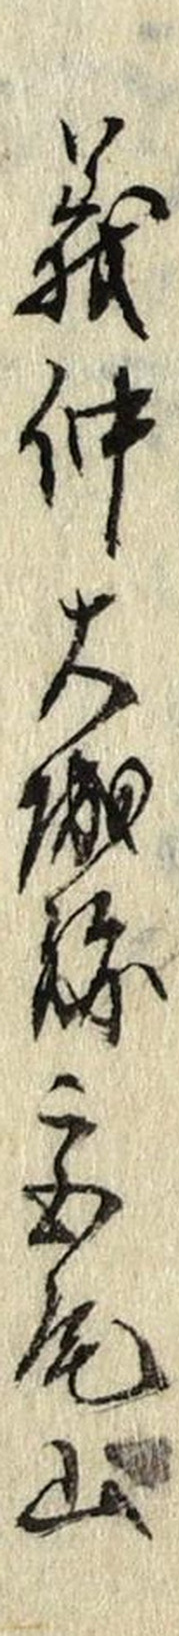義仲大城跡宮尾山
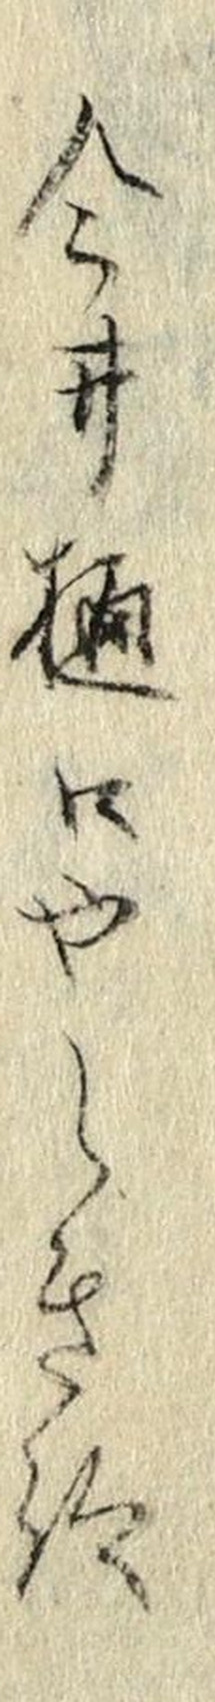今井樋口やしき跡
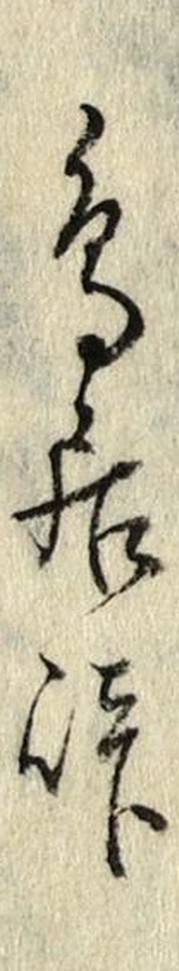鳥居峠

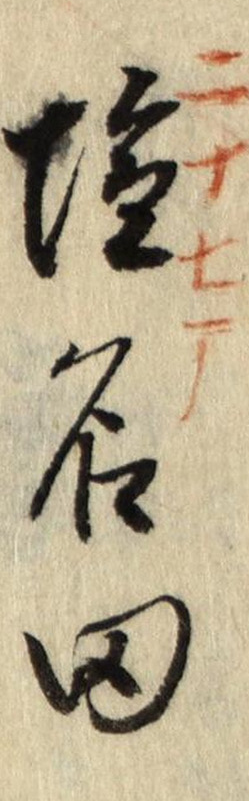塩名田
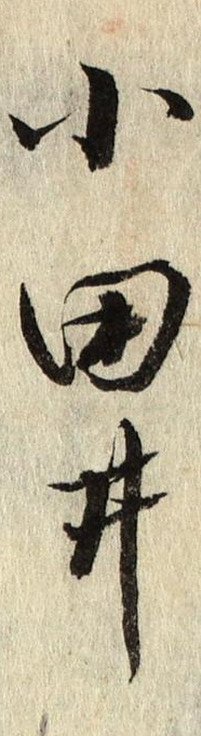小田井
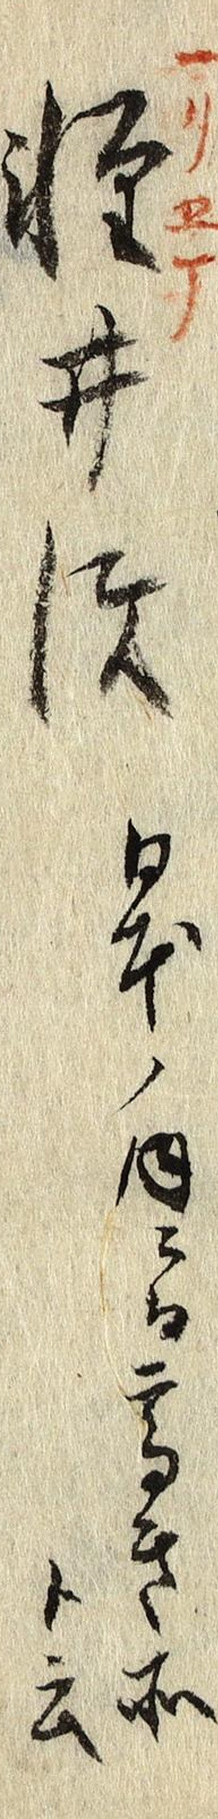軽井沢日本ノ内ニ而高き所
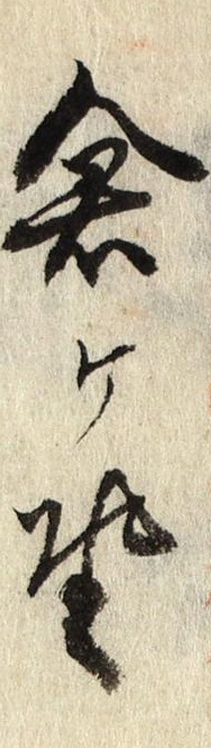倉ヶ野

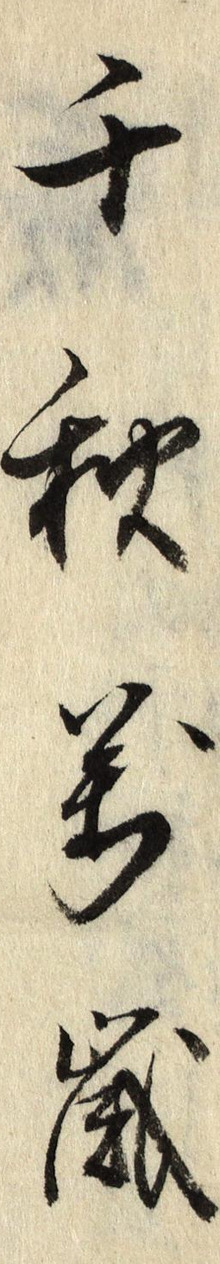千秋万歳
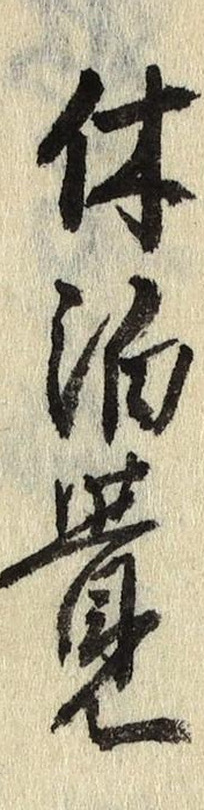休泊覚
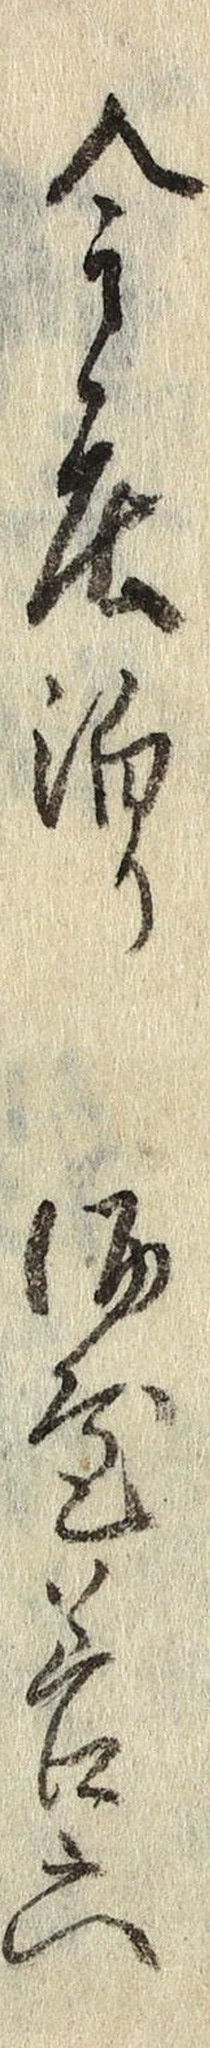今庄泊り酒屋善六
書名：中仙道道中覚
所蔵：福井県文書館 Fukui Prefectural Archives
